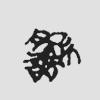{爪言糸}
